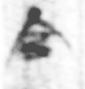宮
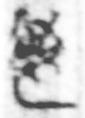廏
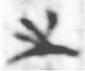之
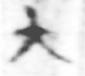入
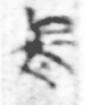長
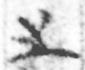之
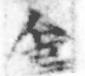○（中）
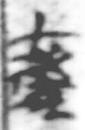𨍱（乘）
